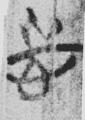志
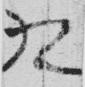九
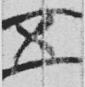五
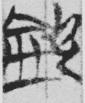欽（感）
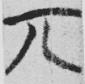亓（其）
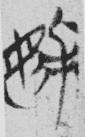拇
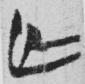亡
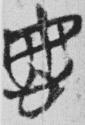悔
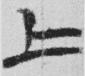上
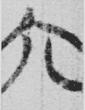六
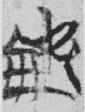欽（感）
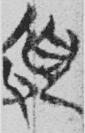○（輔）
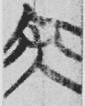夾（頰）
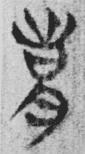○（舌）
